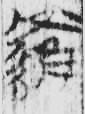羅
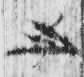之
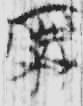廡
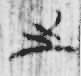之
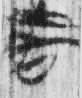者
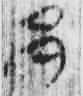邑
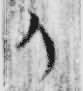人
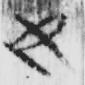女
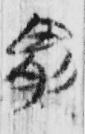{胃刀}（謂）
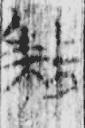殺
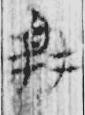嗌
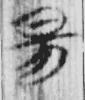昜（陽）
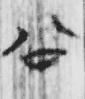公
